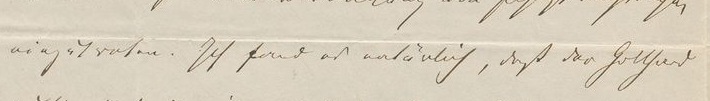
einzutreten. Ich fand es natürlich, daß der Gotthard
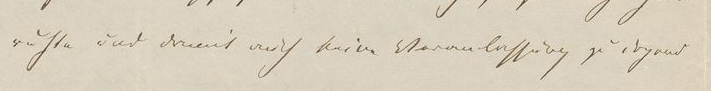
ruhte und damit auch keine Veranlassung zu irgend
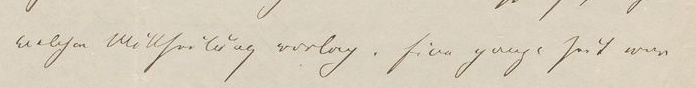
welcher Mittheilung vorlag. Eine ganze Zeit war
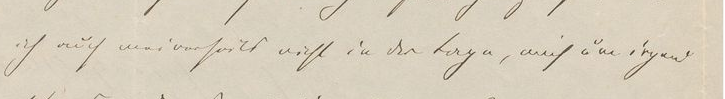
ich auch meinerseits nicht in der Lage, mich um irgend
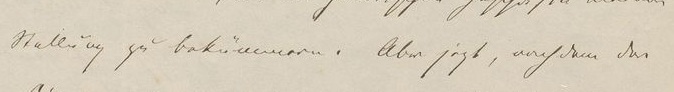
Stellung zu bekümmern. Aber jezt, nachdem der
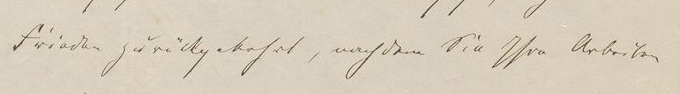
Frieden zurückgekehrt, nachdem Sie Ihre Arbeiten
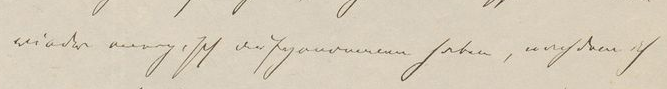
wieder energisch aufgenommen haben, nachdem ich
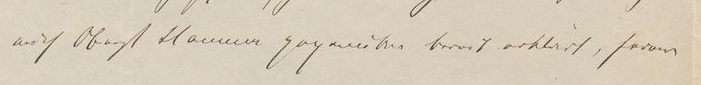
auch Oberst Hammer gegenüber bereit erklärt, ferner
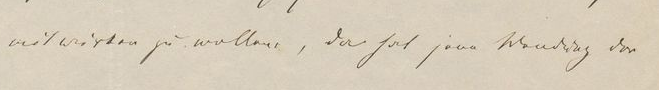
mitwirken zu wollen, da hat jene Wendung der
